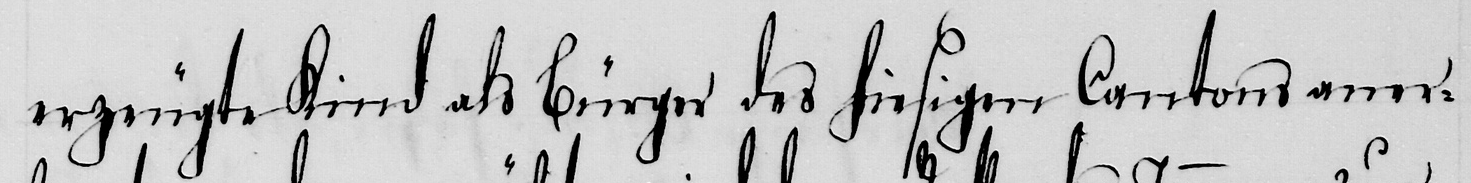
erzeugte Kind als Bürger des hiesigen Cantons aner¬
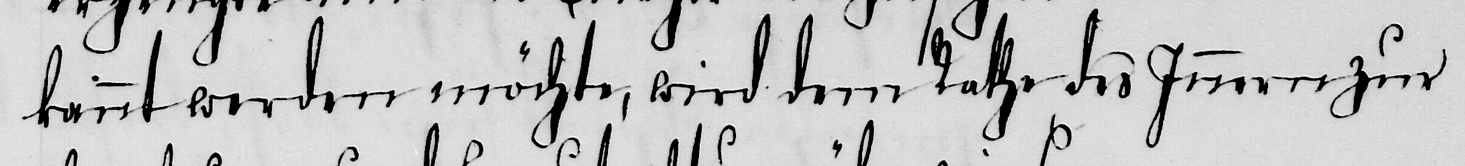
kannt werden möchte, wird dem Rathe des Innern zur
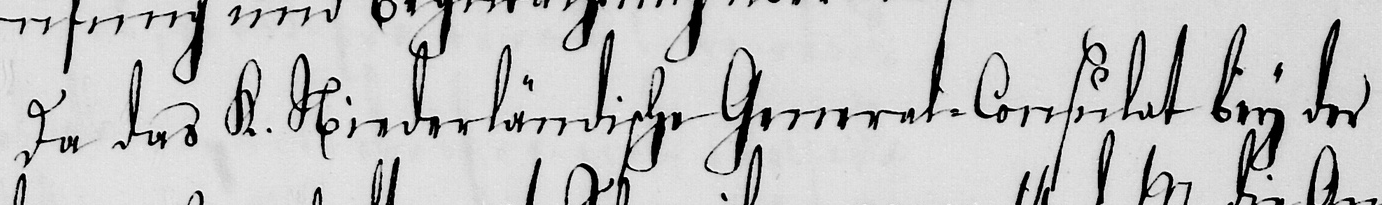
Da das K. Niederländische General-Consulat bey der
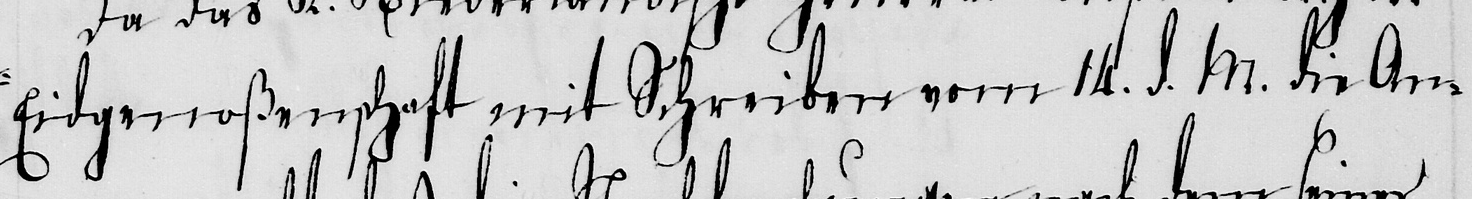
Eidgenoßenschaft mit Schreiben vom 14. d. M. die An¬
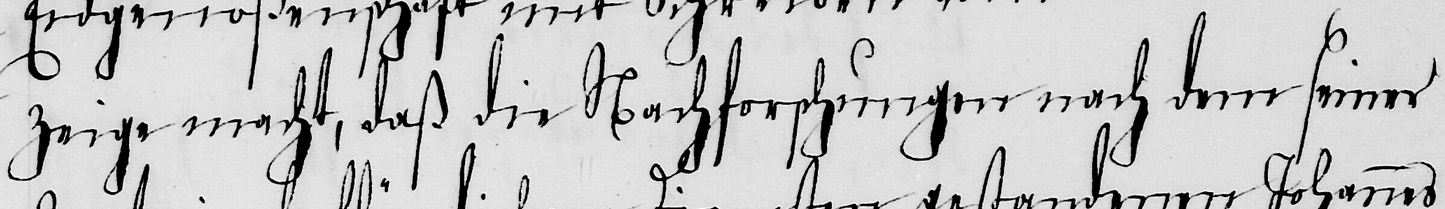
zeige macht, daß die Nachforschungen nach dem seiner
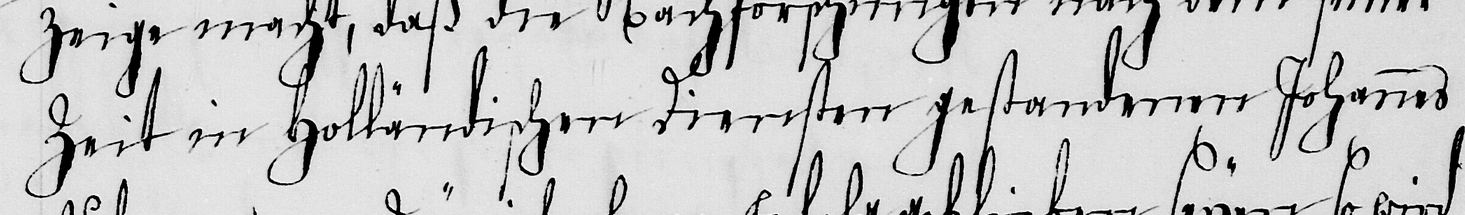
Zeit in Holländischen Diensten gestandenen Johannes
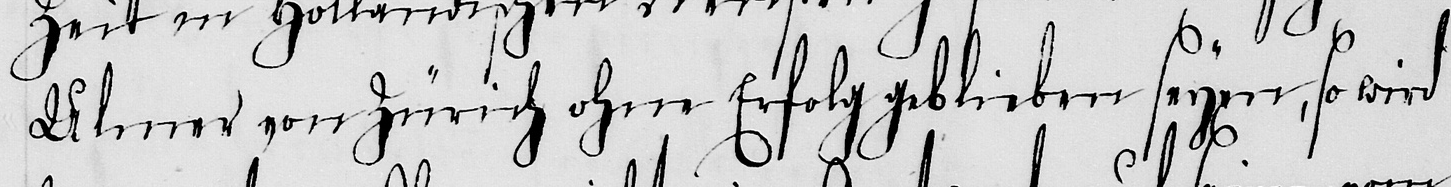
Ulmer von Zürich ohne Erfolg geblieben seyen, so wird
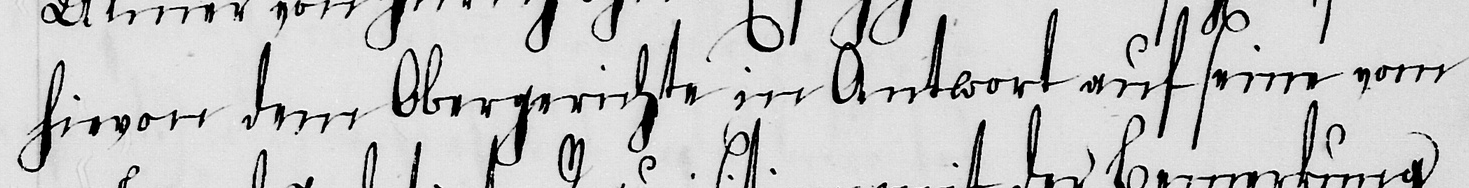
hievon dem Obergerichte in Antwort auf seine vom
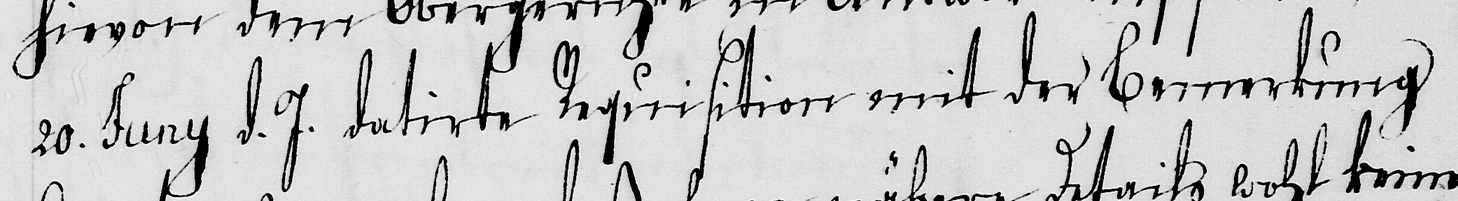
20. Juny d. J. datirte Requisition mit der Bemerkung
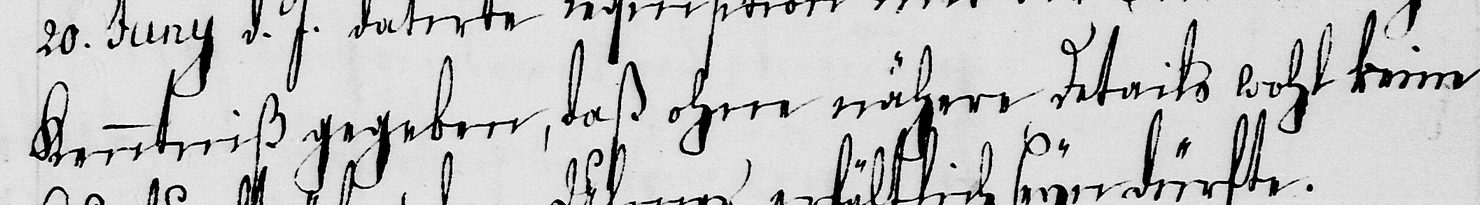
Kenntniß gegeben, daß ohne nähere Details wohl keine
